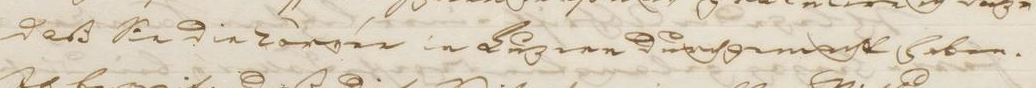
daß Sie die Corvée in Luzern durchgemacht haben.
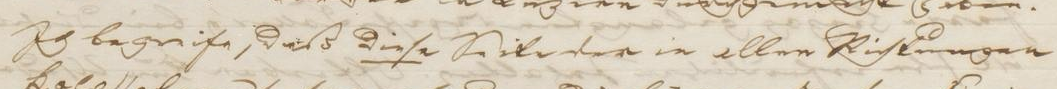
Ich begreife, daß diese Seite der in allen Richtungen
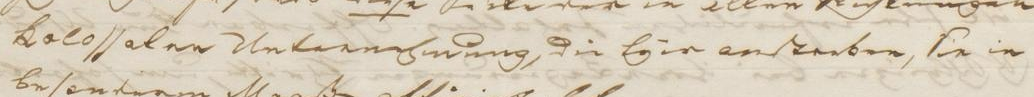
kolossalen Unternehmung, die wir anstreben, Sie in
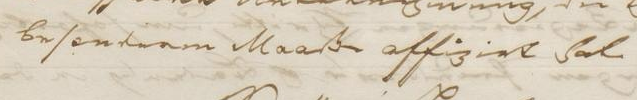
besonderm Maaße affizirt hat.
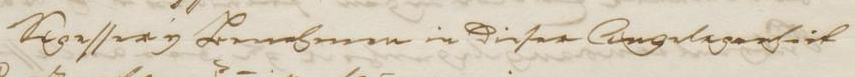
Segesser's Benehmen in dieser Angelegenheit
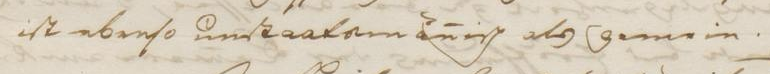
ist ebenso unstaatsmännisch als gemein.
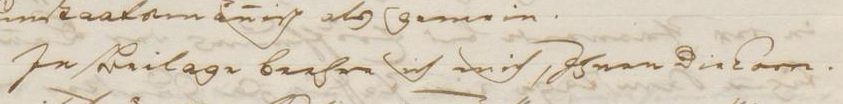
In Beilage beehre ich mich, Ihnen die Corre-
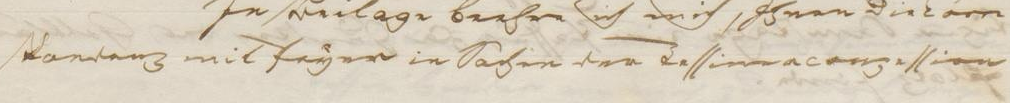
spondenz mit Peyer in Sachen der Tessinerconzession
